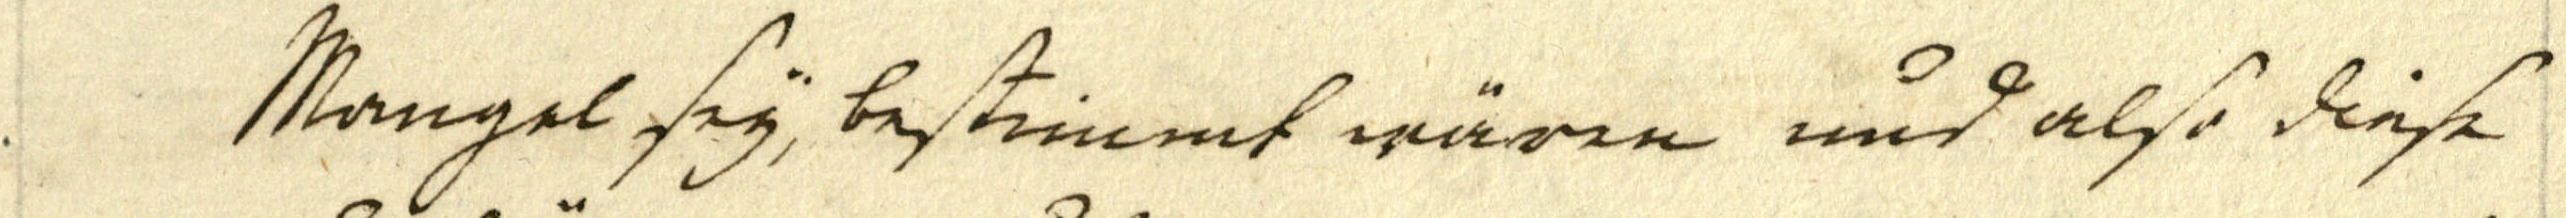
Mangel seÿ, bestimmt wären und also diese
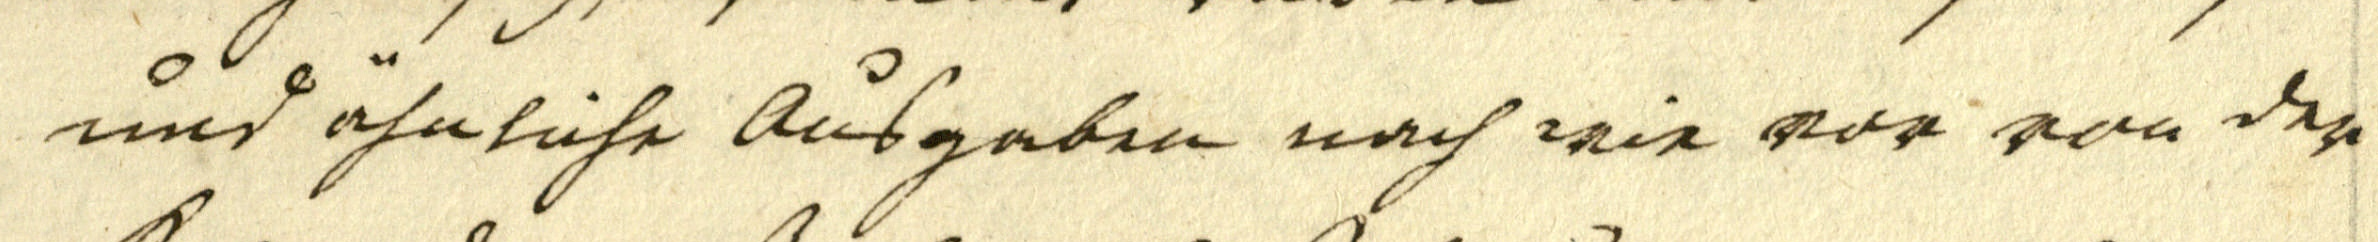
und ähnliche Ausgaben nach wie vor von der
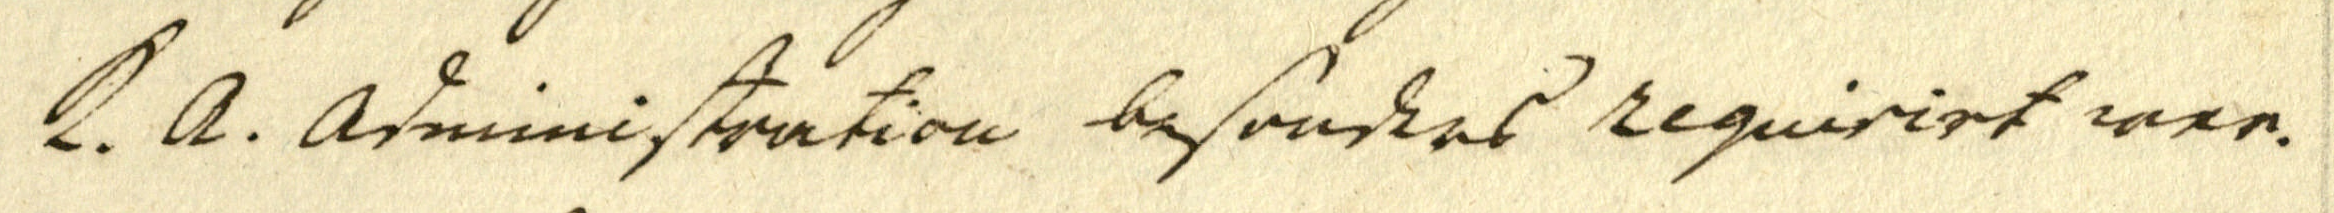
K. A. Aadministration besonders requiriret wer¬
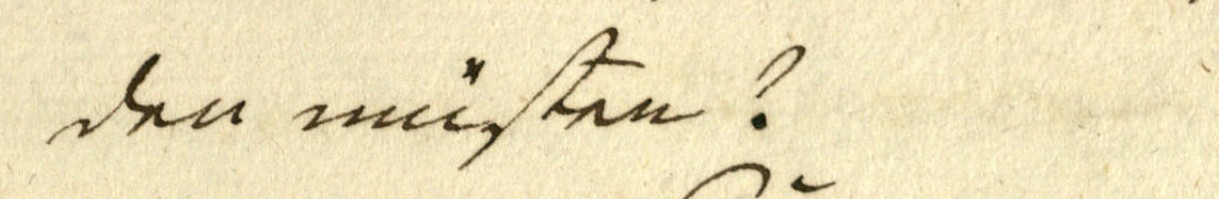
den müsten?
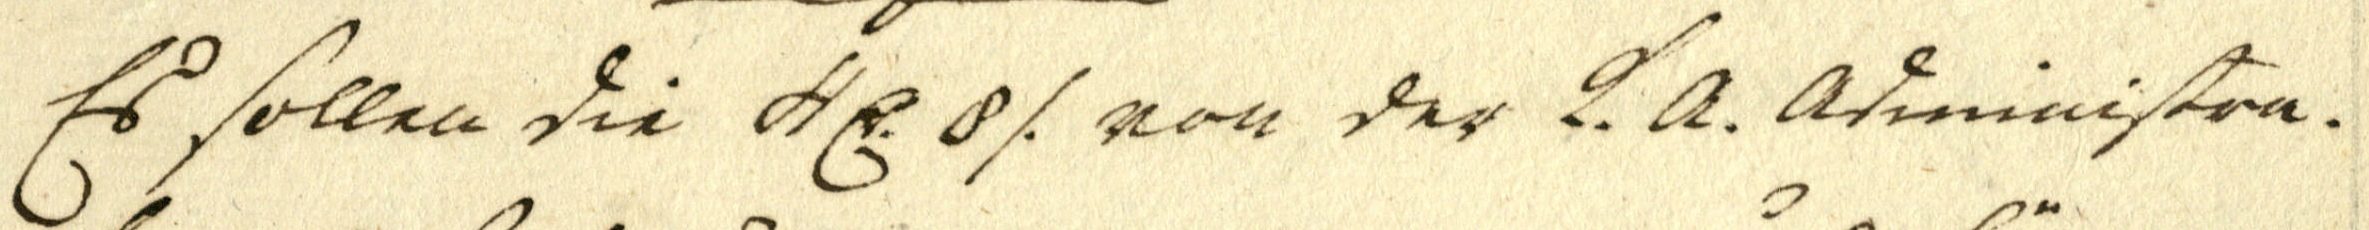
Es sollen die 4 l. 8 s. von der K. A. Administra¬
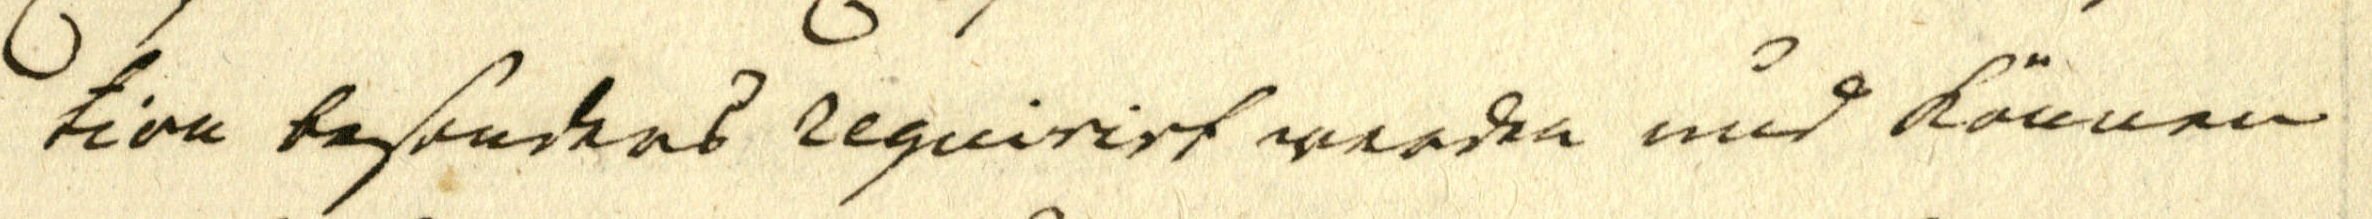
tion besonders requiriret werden und können
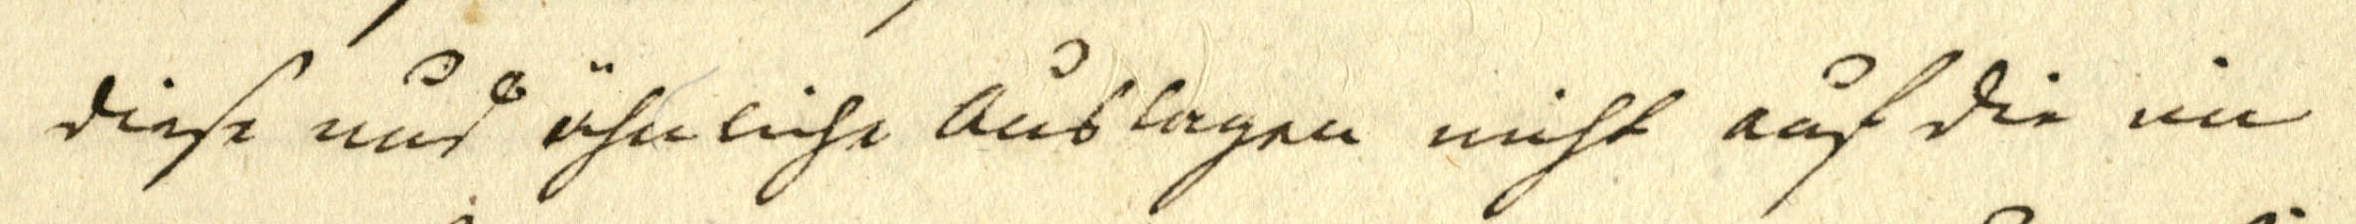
diese und ähnliche Auslagen nicht auf die im
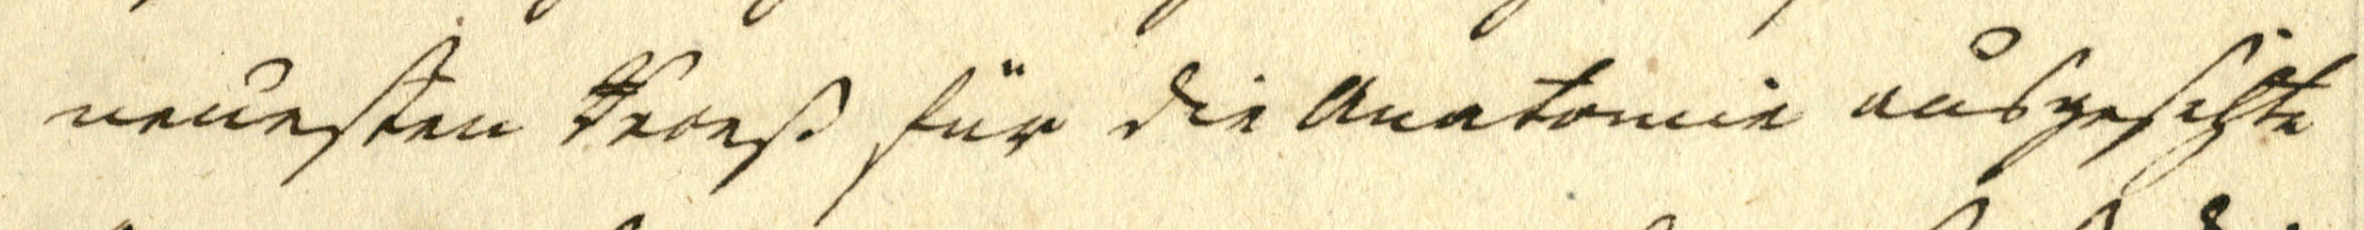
neuesten Receß für die Anatomie ausgesetzte
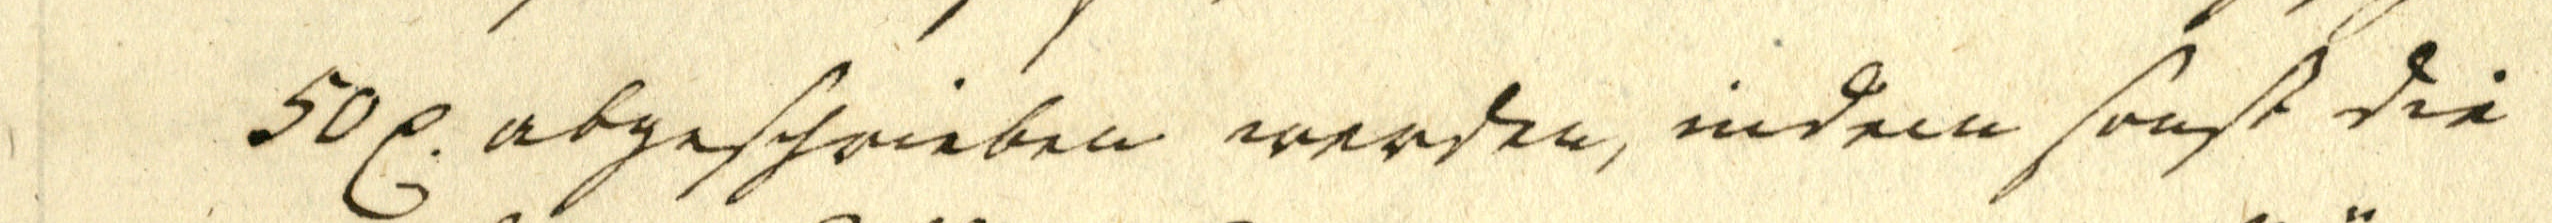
50 l. abgeschrieben werden, indem sonst die
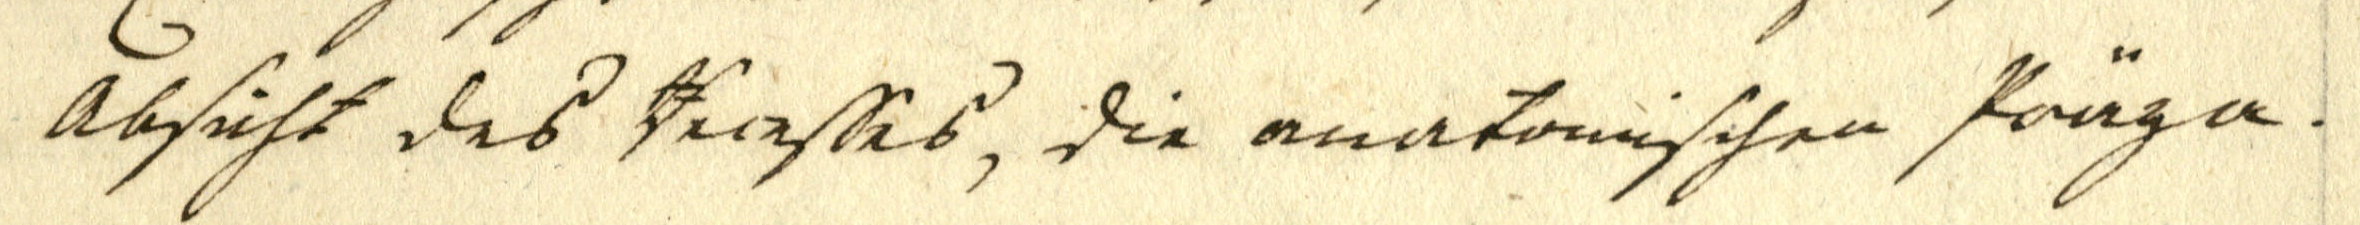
Absicht des Recesses, die anatomischen Prä¬
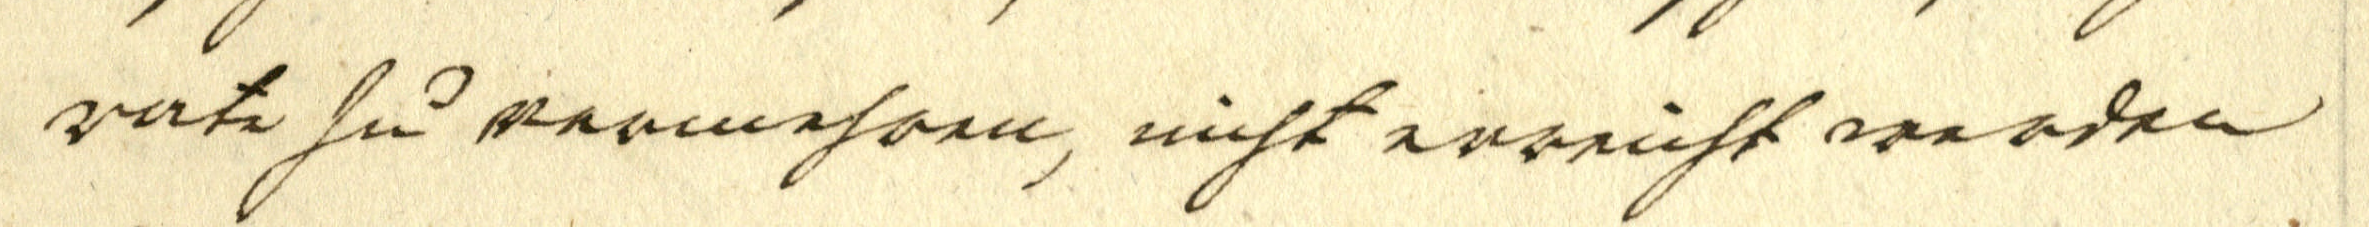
parate zu vermehren, nicht erreicht werden
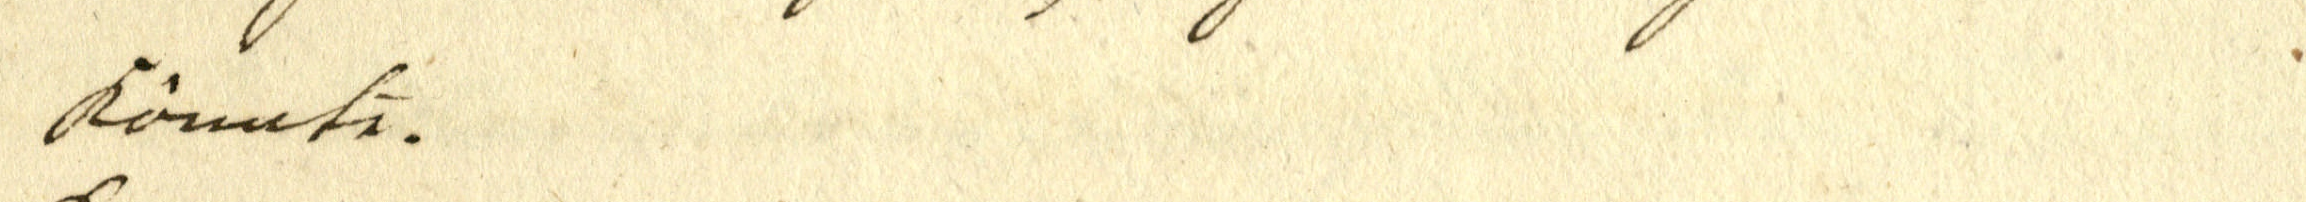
könnte.
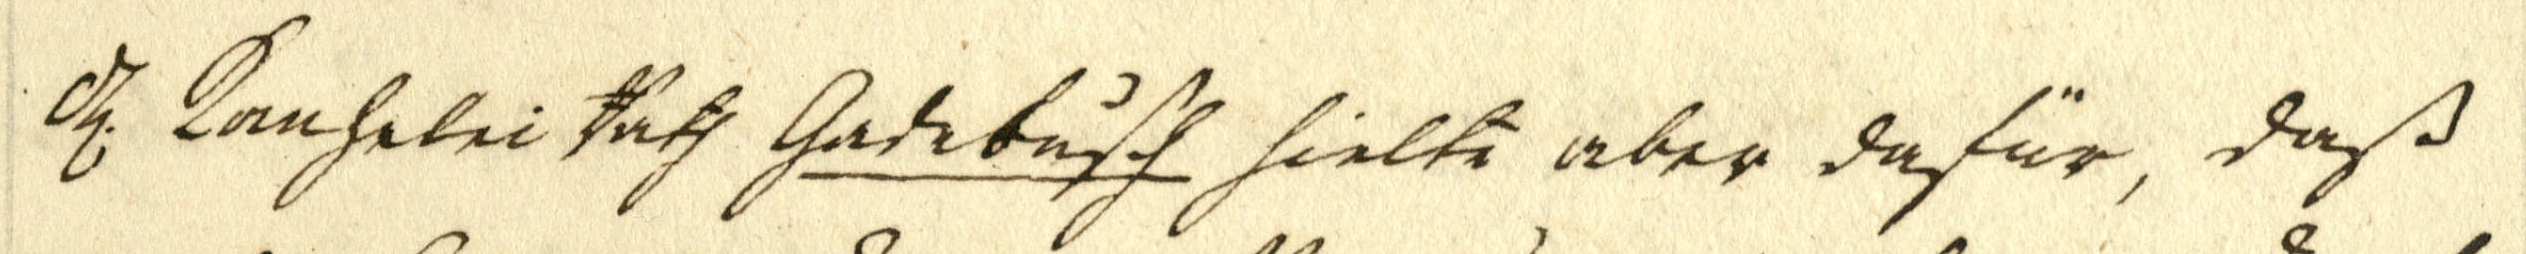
dh. Kanzelei Rath Gadebusch hielte aber dafür, daß
